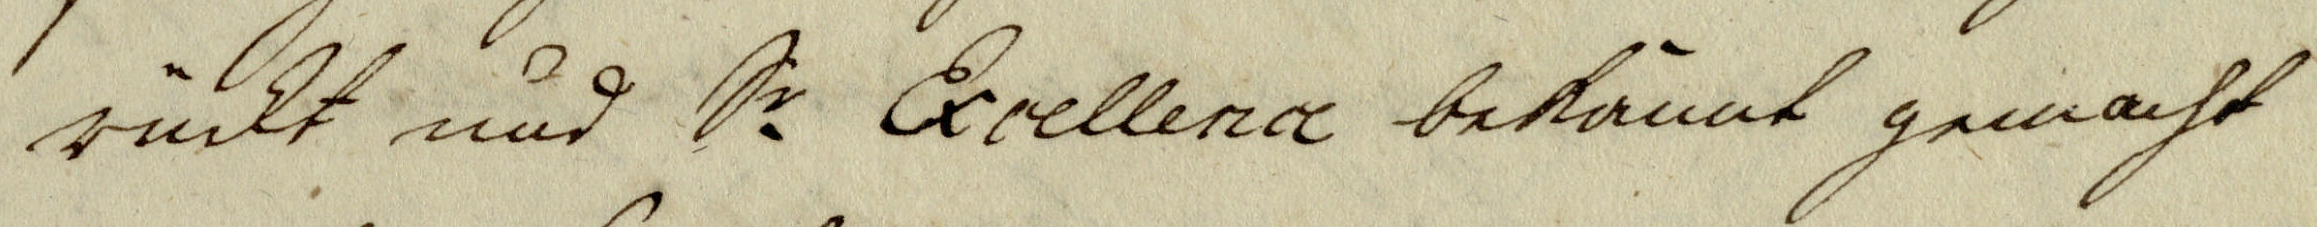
rückt und Sr. Excellence bekannt gemacht
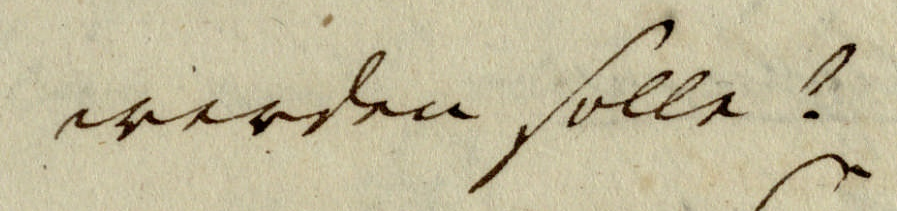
werden solle?
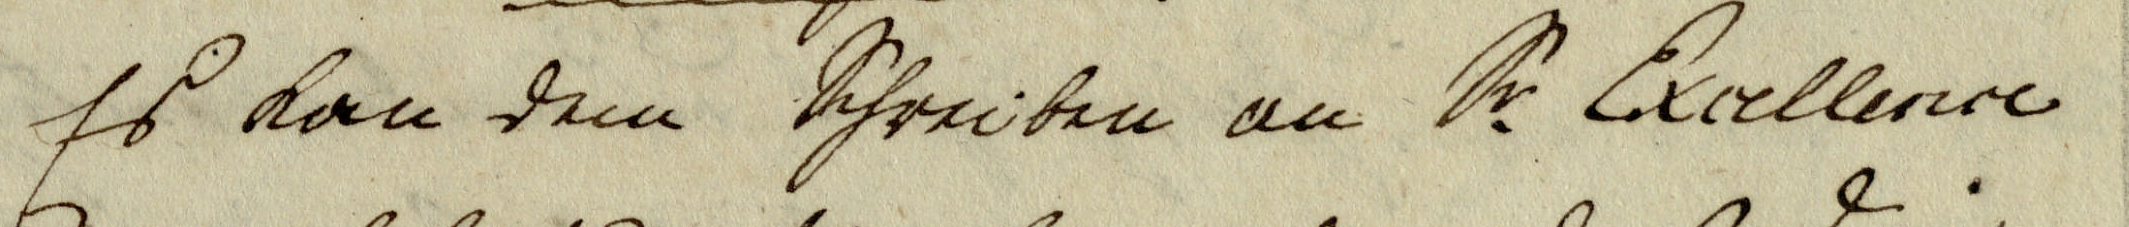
Es kan dem Schreiben an Sr. Excellence
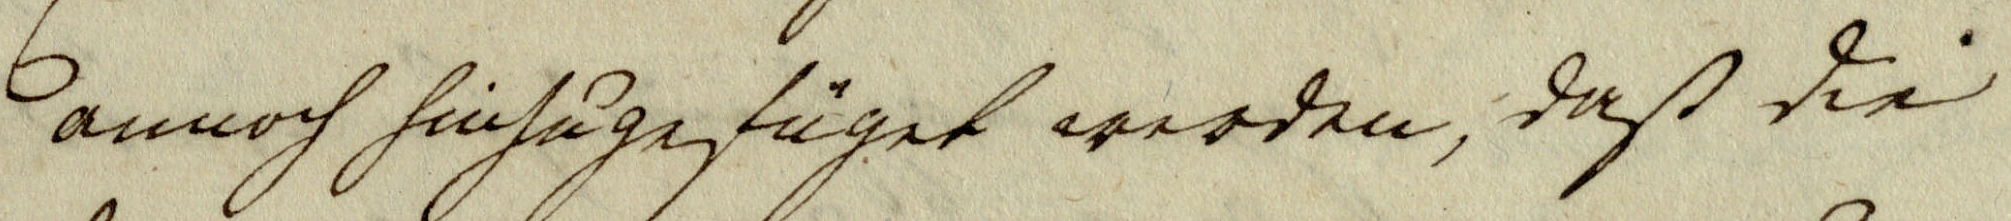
annoch hinzugefüget werden, daß die
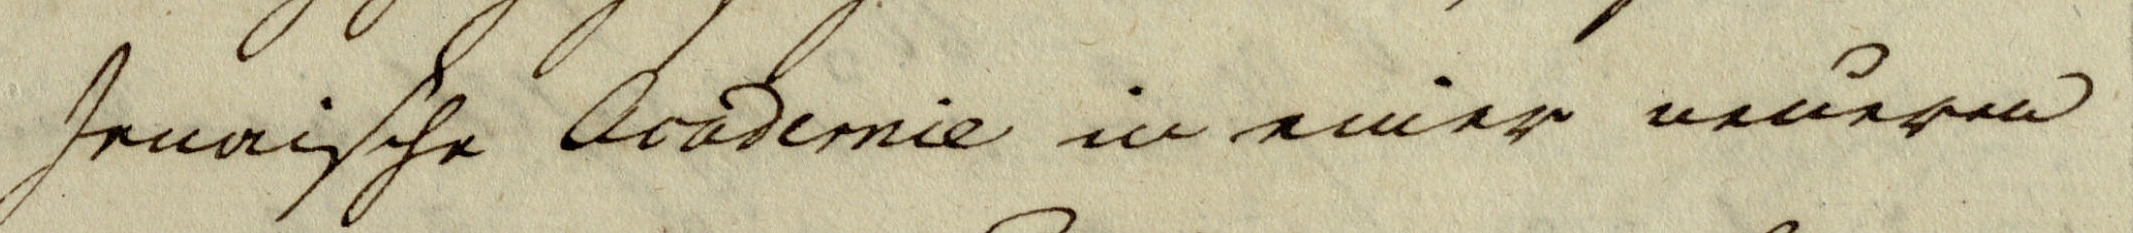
Jenaische Academie in einer neueren
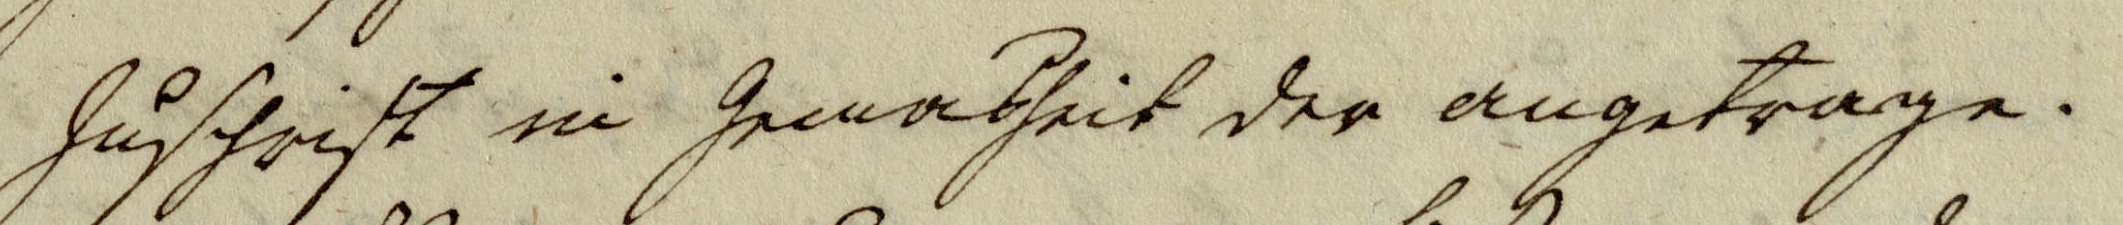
Zuschrift in Gemasheit der angetrage¬
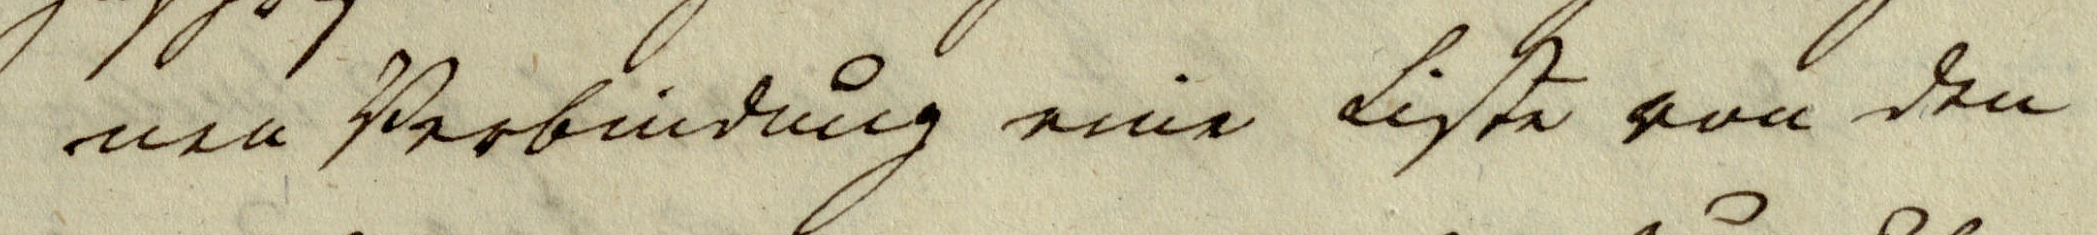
nen Verbindung eine Liste von den
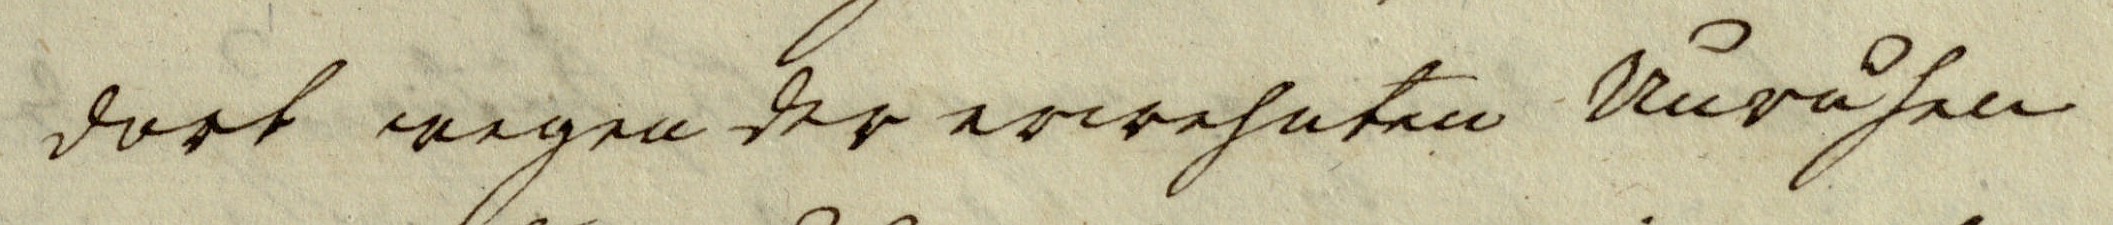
dort wegen der erwehnten Unruhen
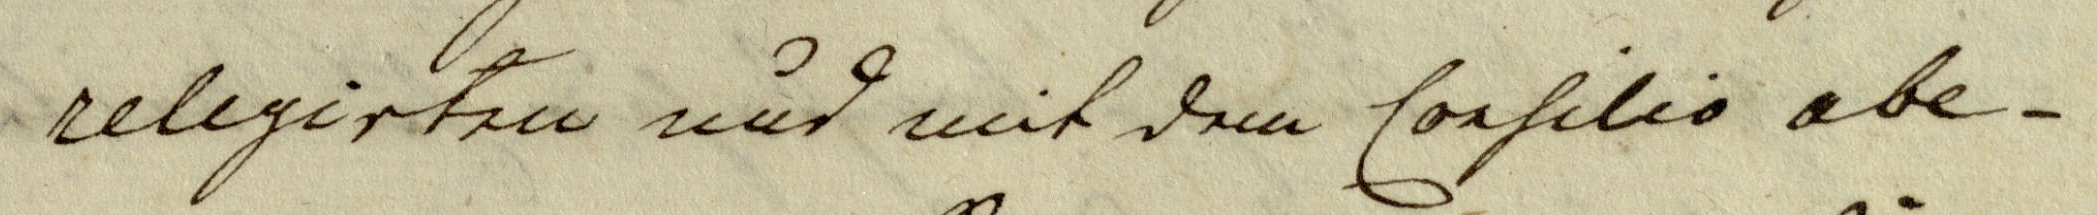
relegirten und mit dem Consilio abe¬
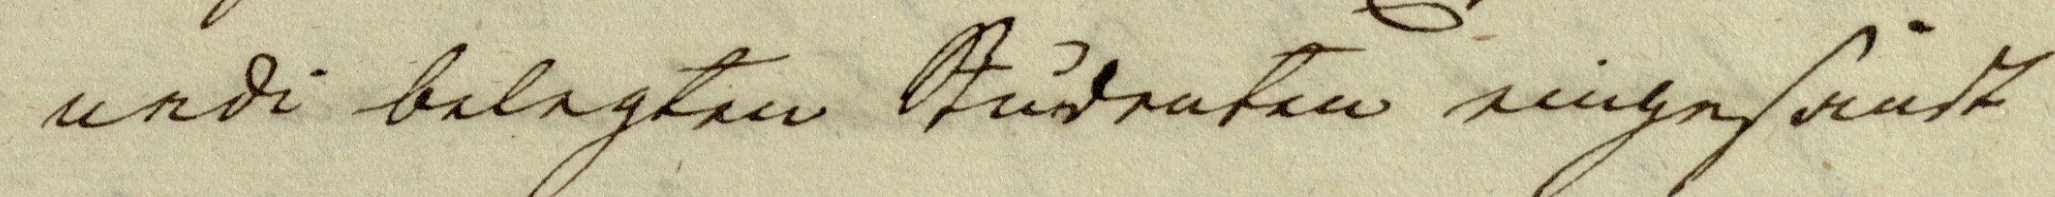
undi belegten Studenten eingesandt
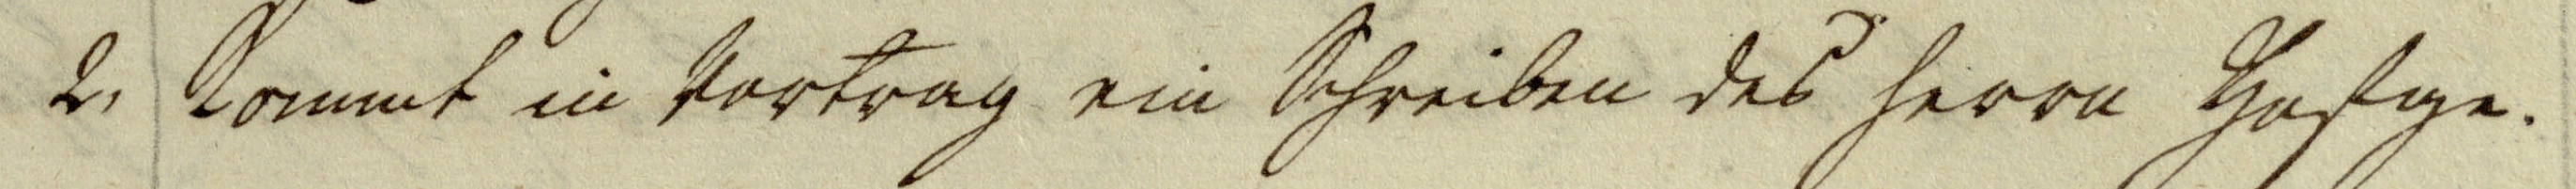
2., Kommt in Vortrag ein Schreiben des Herrn Hofge¬
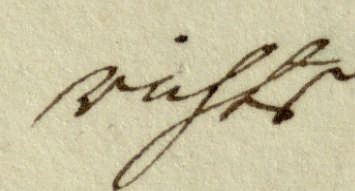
richts
